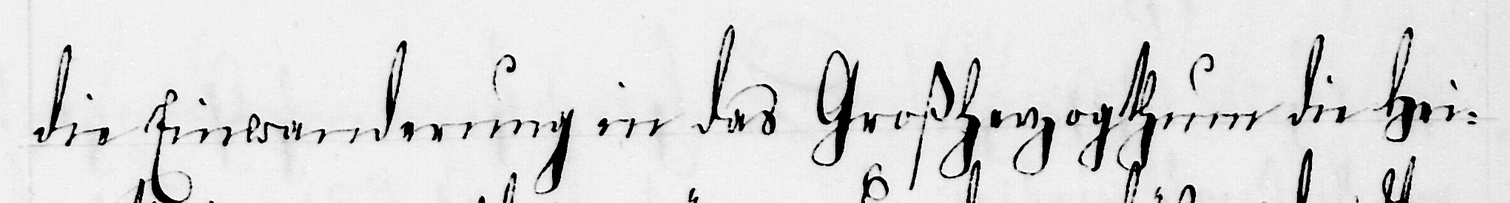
die Einwanderung in das Großherzogthum die Hei¬
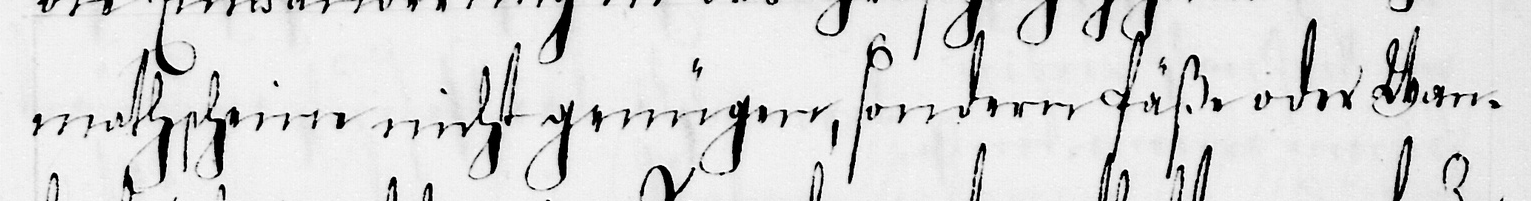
mathscheine nicht genügen, sondern Päße oder Wan¬
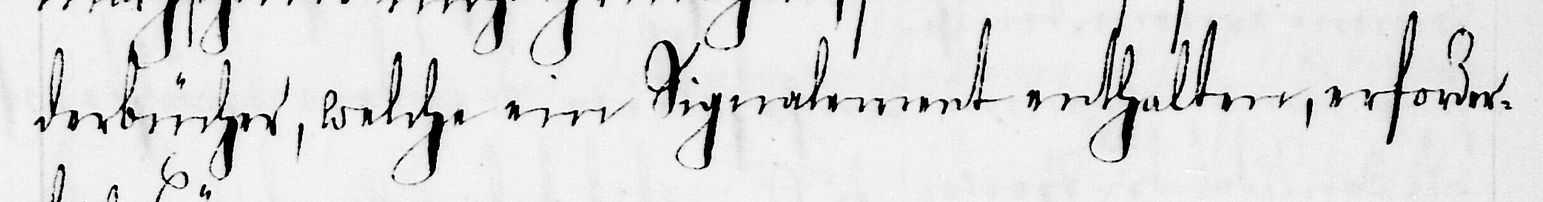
derbücher, welche ein Signalement enthalten, erforder¬
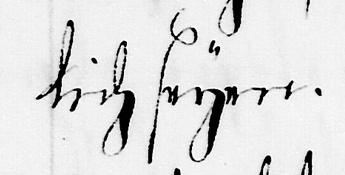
lich seyen.
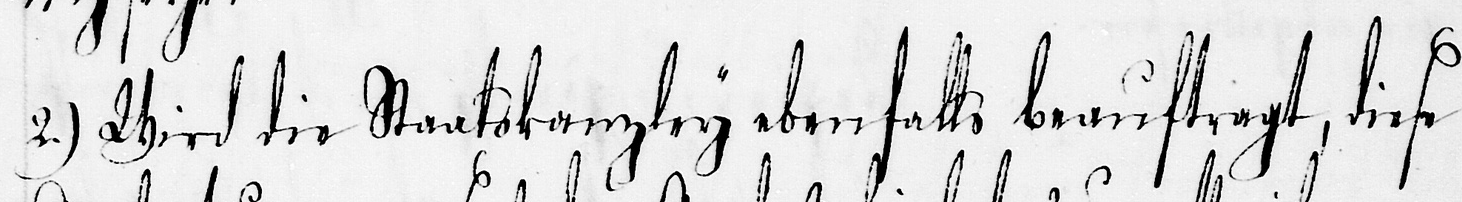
2.) Wird die Staatskanzley ebenfalls beauftragt, diese
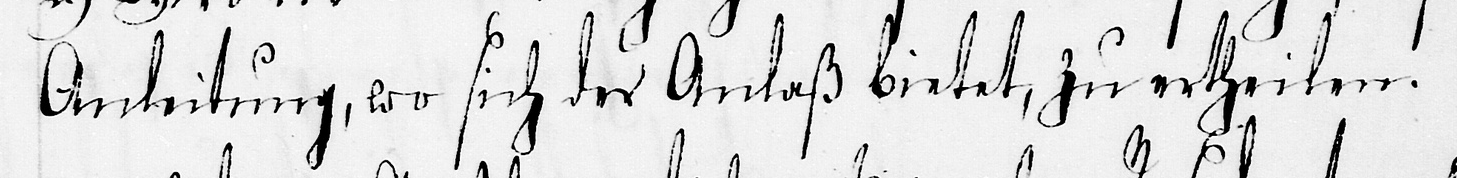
Anleitung, wo sich der Anlaß bietet, zu ertheilen.
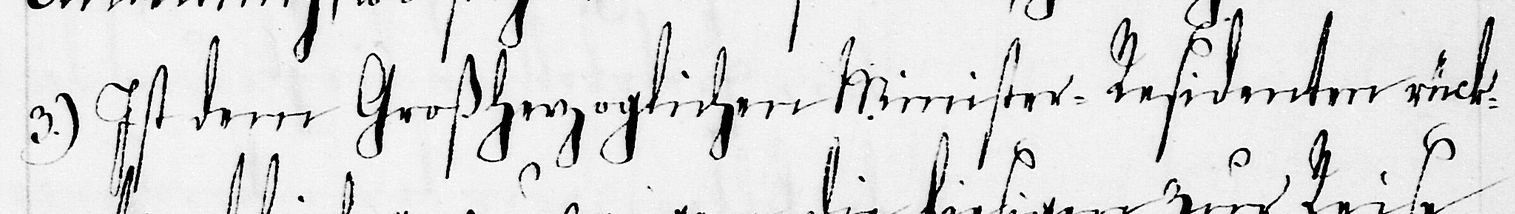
3.) Ist dem Großherzoglichen Minister-Residenten rück¬
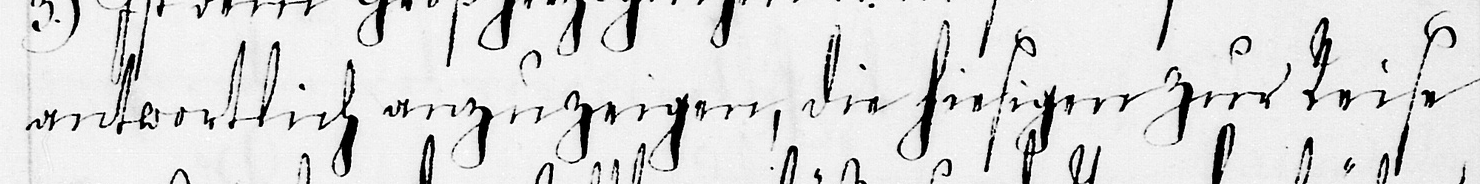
antwortlich anzuzeigen, die hiesigen zur Reise
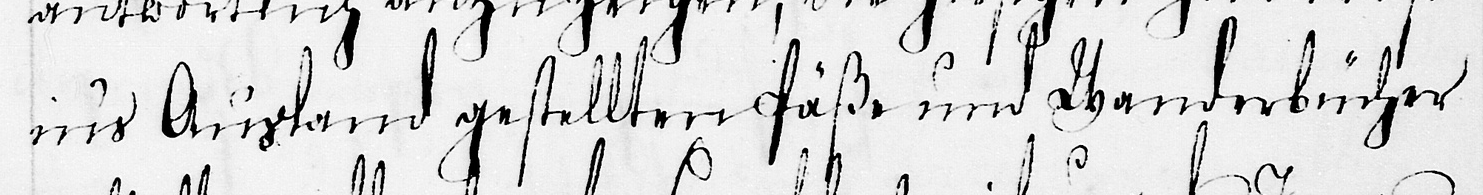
in’s Ausland gestellten Päße und Wanderbücher
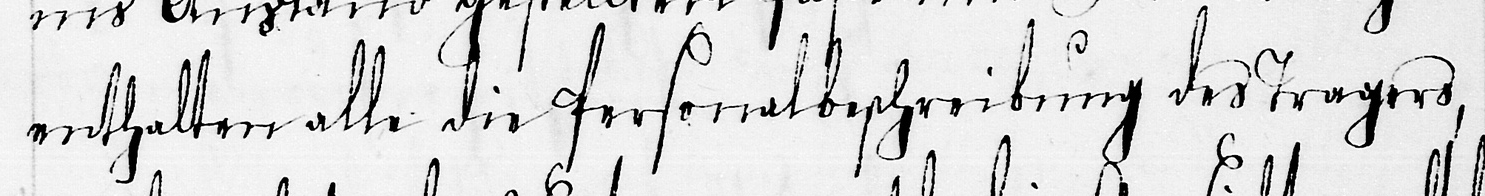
enthalten alle die Personalbeschreibung des Tragers,
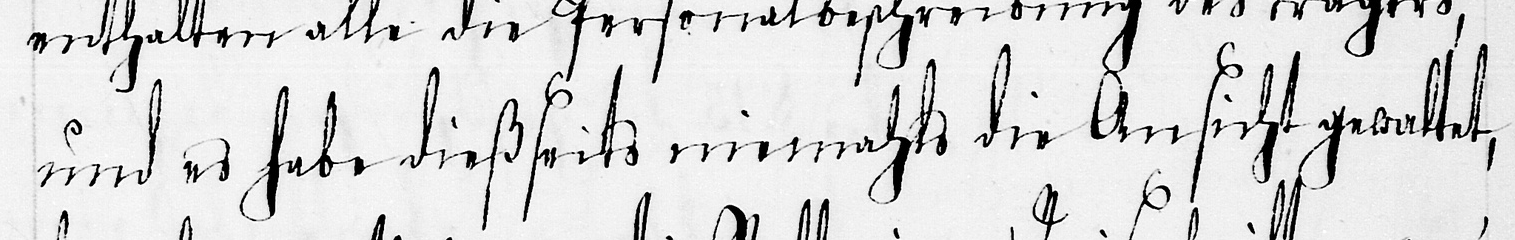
und es habe dießseits niemahls die Ansicht gewaltet,
